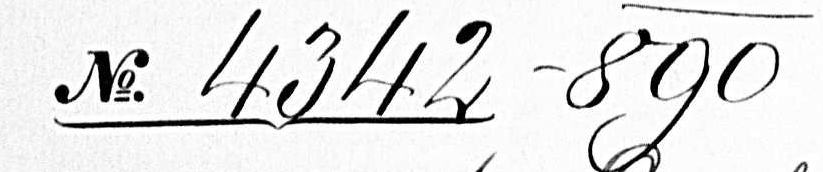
No. 4342-890
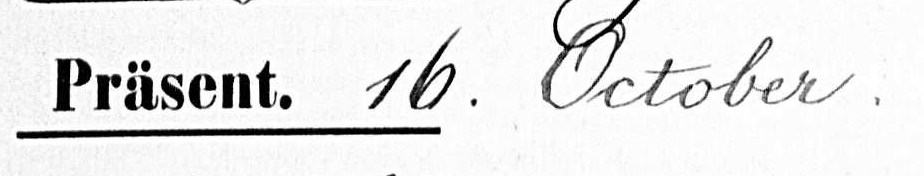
Präsent. 16. October
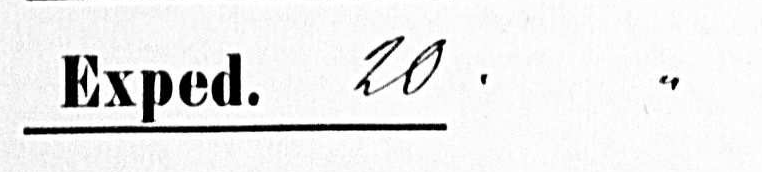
Exped. 20. October
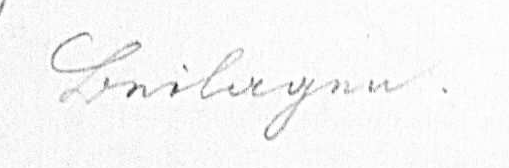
Beilagen.
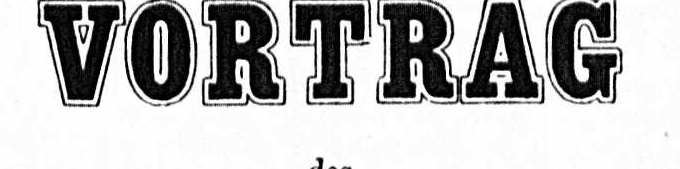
Vortrag
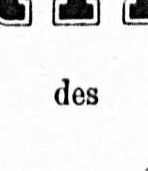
des
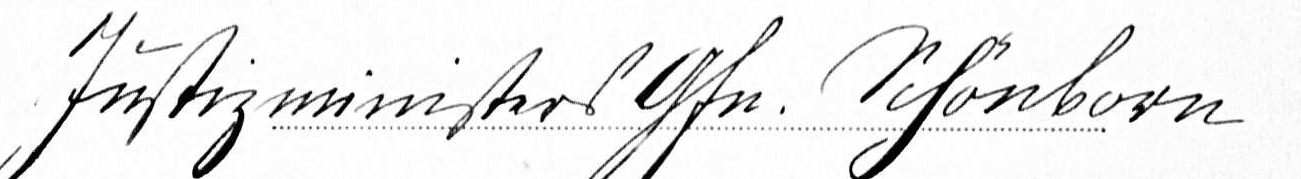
Justizministers Gfe. Schöborn
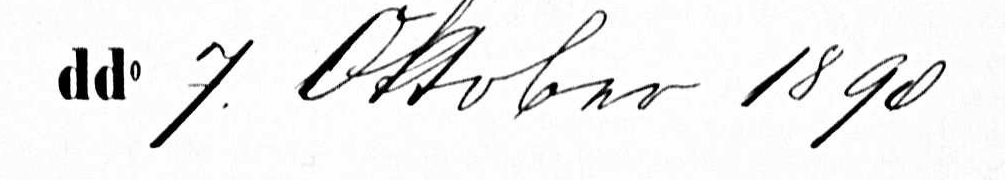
ddo 7. Oktober 1890
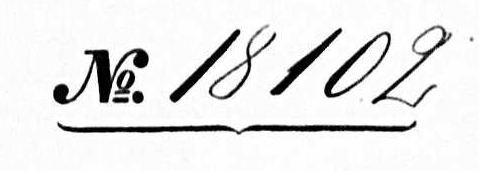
No. 18102
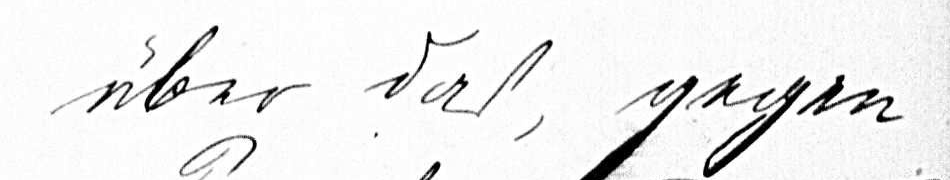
über das, gegen
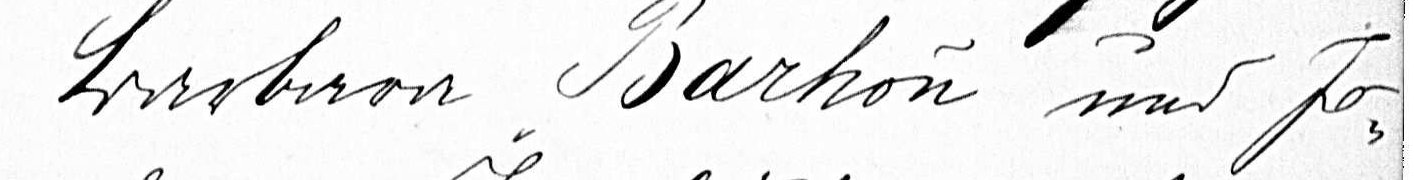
Barbara Barhxx und Jo¬
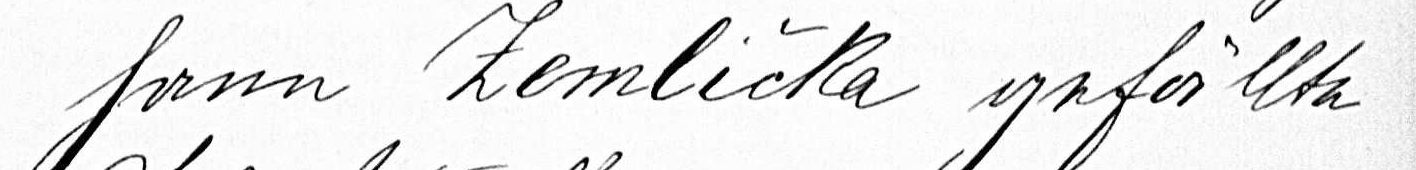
hann Žemlička gefällte
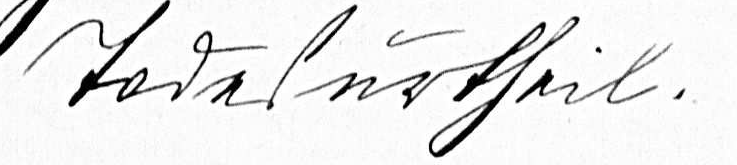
Todesurtheil.
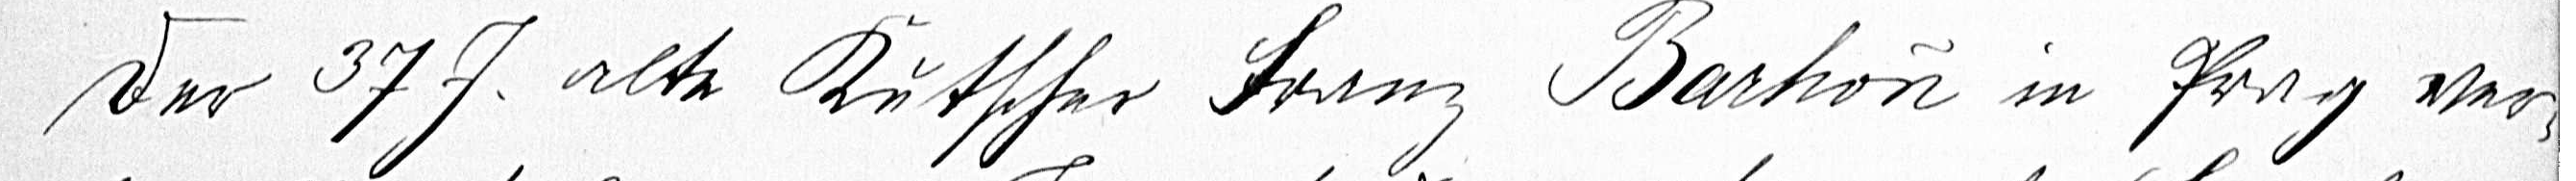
Der 37 J. alte Kutscher Franz Barhxx in Prag ver¬
